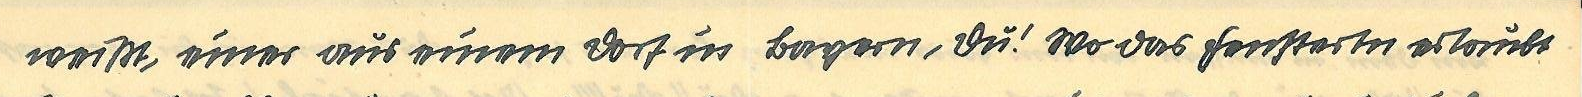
weißt, einer aus einem Dorf in Bayern, Du! Wo das Fensterln erlaubt
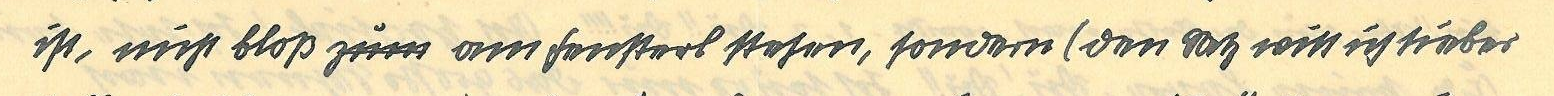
ist, nicht bloß zum am Fensterl stehen, sondern (den Satz will ich lieber
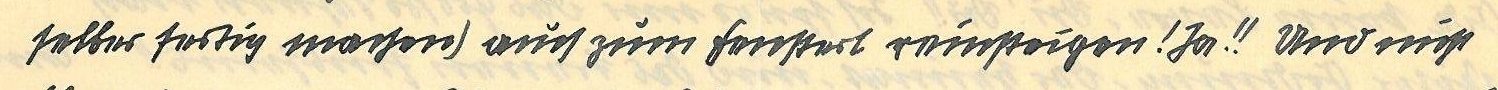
selber fertig machen) auch zum Fensterl reinsteigen! Ja!! Und nicht
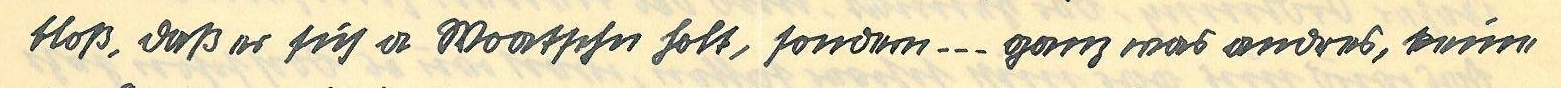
bloß, daß er sich a Woatschn holt, sondern – – – ganz was andres, keine
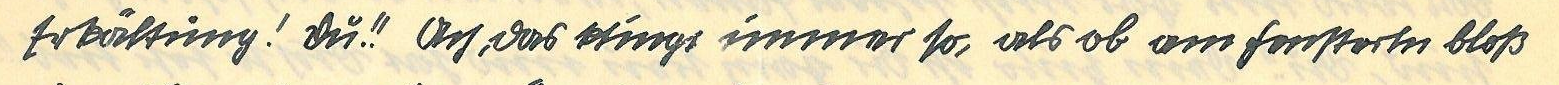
Erkältung! Du!! Ach, das klingt immer so, als ob am Fensterln bloß
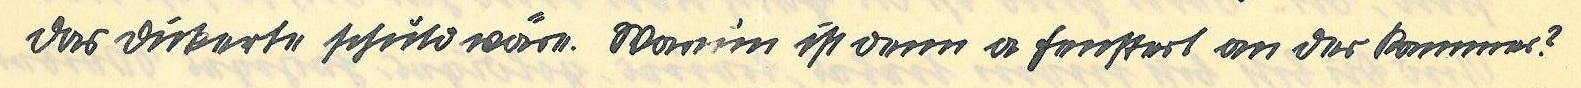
das Dickerle schuld wäre. Warum ist denn a ein Fensterl an der Kammer?
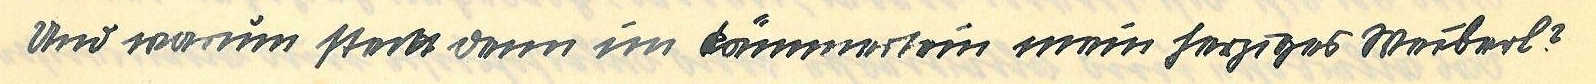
Und warum steckt dann im Kämmerlein mein herziges Weiberl?
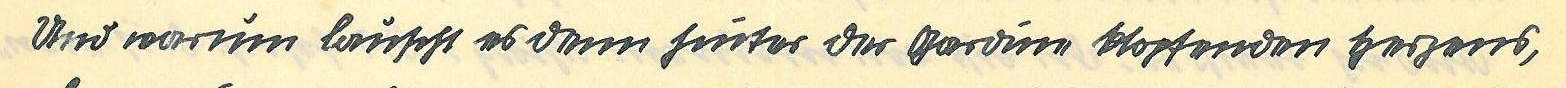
Und warum lauscht es denn hinter der Gardine klopfenden Herzens,
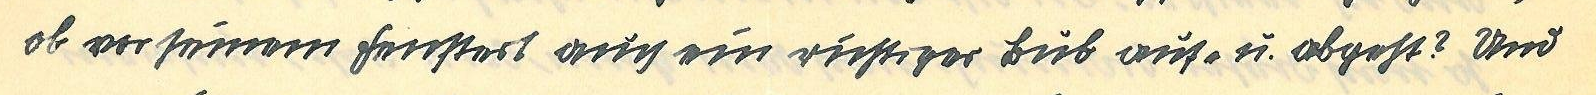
ob vor seinem Fensterl auch ein richtiger Bub auf– und. abgeht? Und
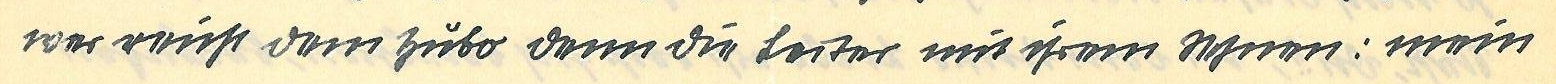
wer reicht dem Hubo denn die Leiter mit ihrem Sehnen: mein
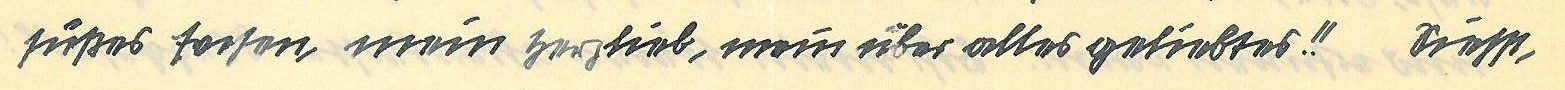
süßes Evchen, mein Herzlieb, mein über alles geliebtes!! Siehst,
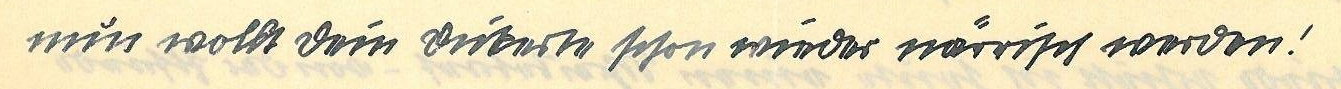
nun wollt dein Dickerle schon wieder närrisch werden!
